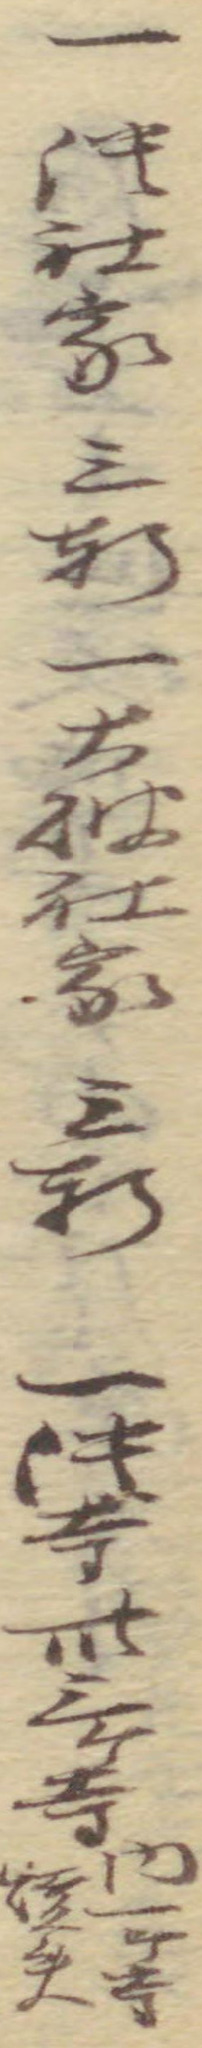一潰社家三軒一大破社家三軒一潰寺卅三ケ寺内壱ケ寺焼失
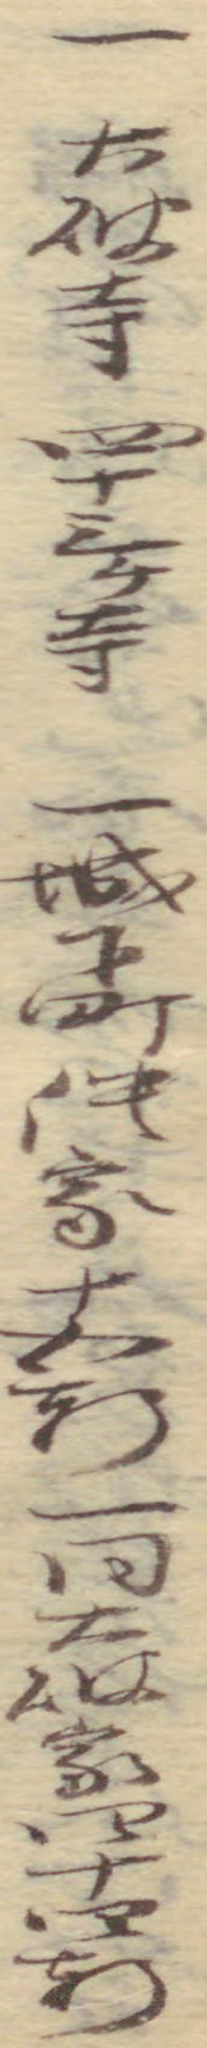一大破寺四十三ケ寺一城下町潰家十五軒一同大破家四十四軒
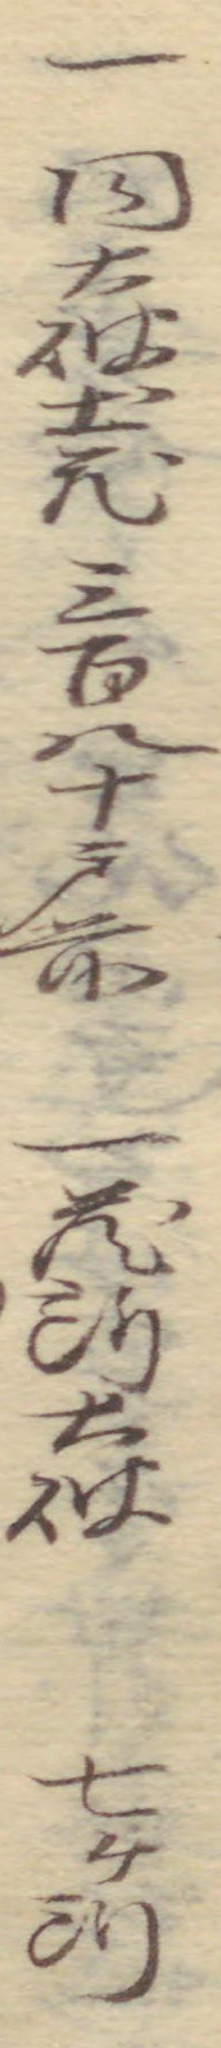一同大破土蔵三百八十戸前一蔵所大破七ケ所
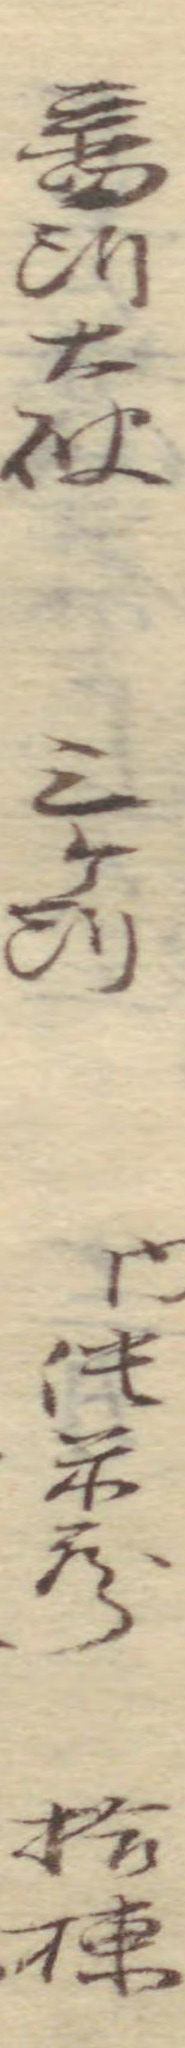一番所大破三ケ所内潰米蔵拾棟
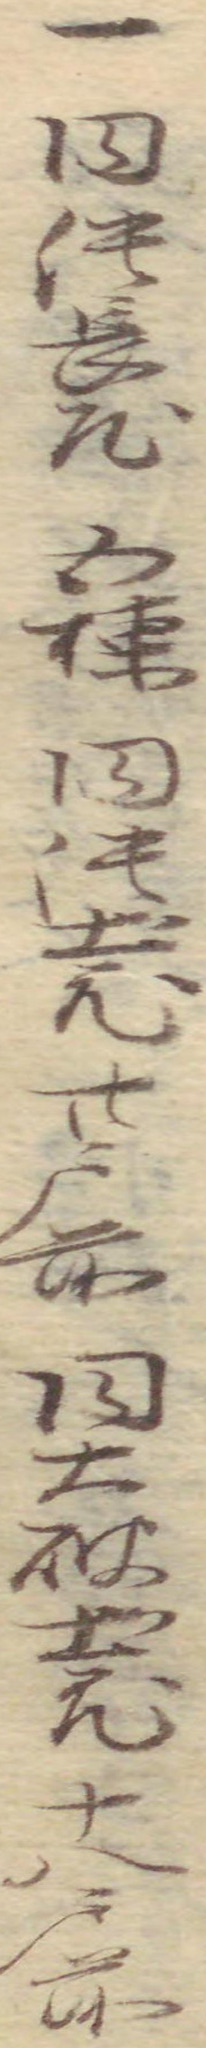一同潰長屋五棟同潰土蔵廿戸前同大破土蔵十八戸前
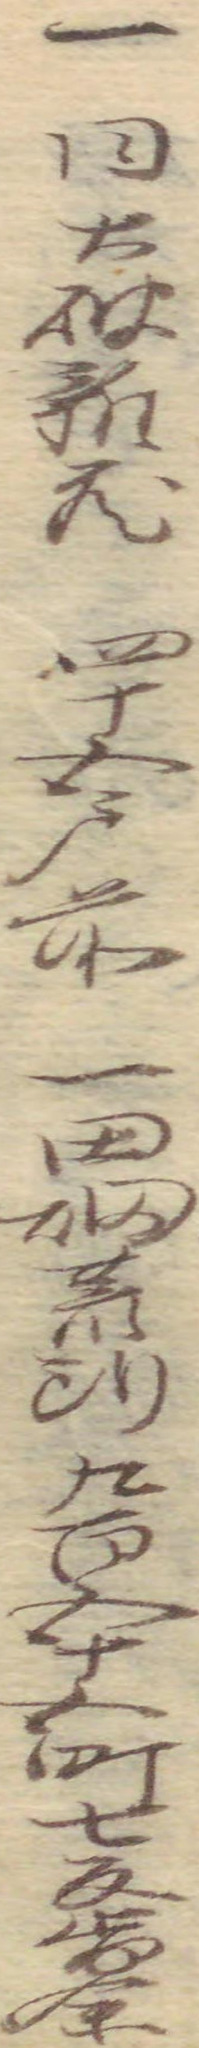一同大破新蔵四十五戸前一田畑荒所九百五十五町七反歩余
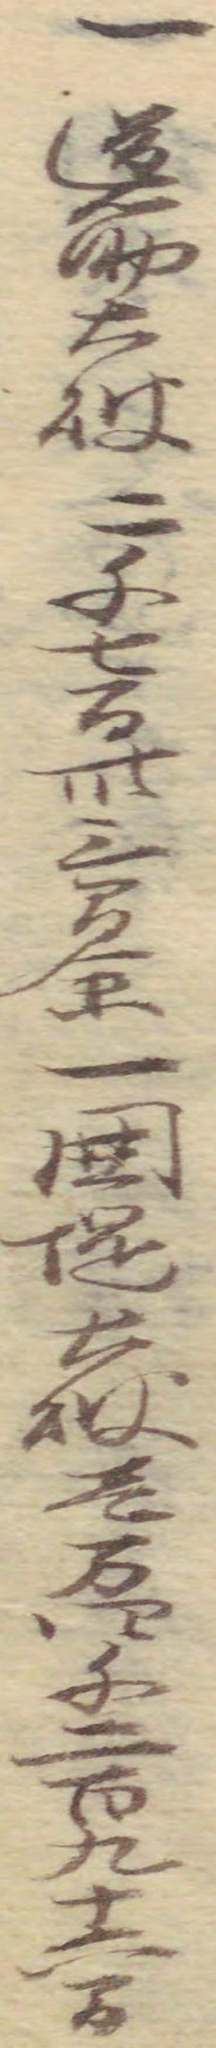一道筋大破二千七百卅三間余一囲堤大破壱万四千二百九十六間
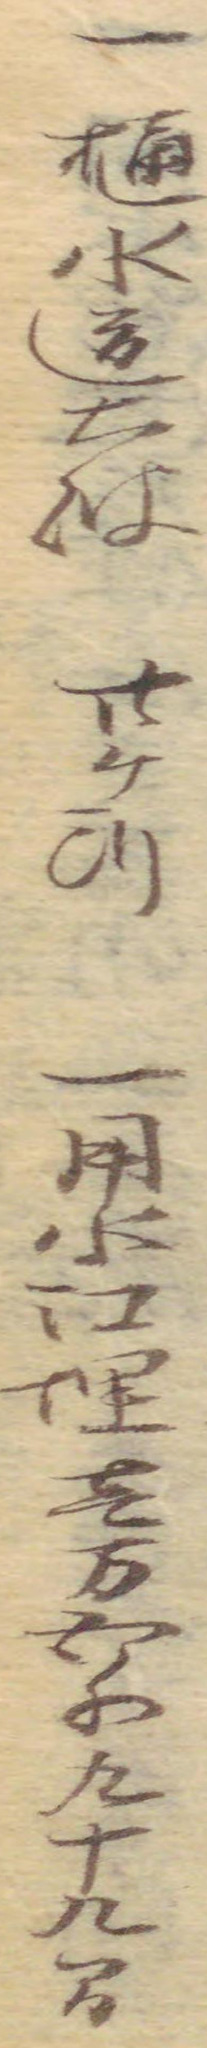一樋水道大破廿ケ所一用水江埋壱万五千九十九間

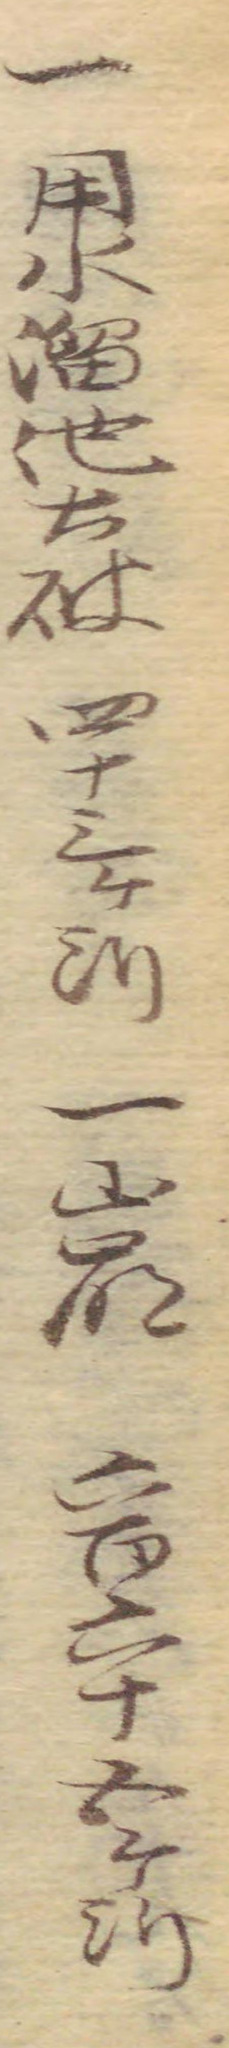一用水溜池大破四十三ケ所一山崩六百六十五ケ所
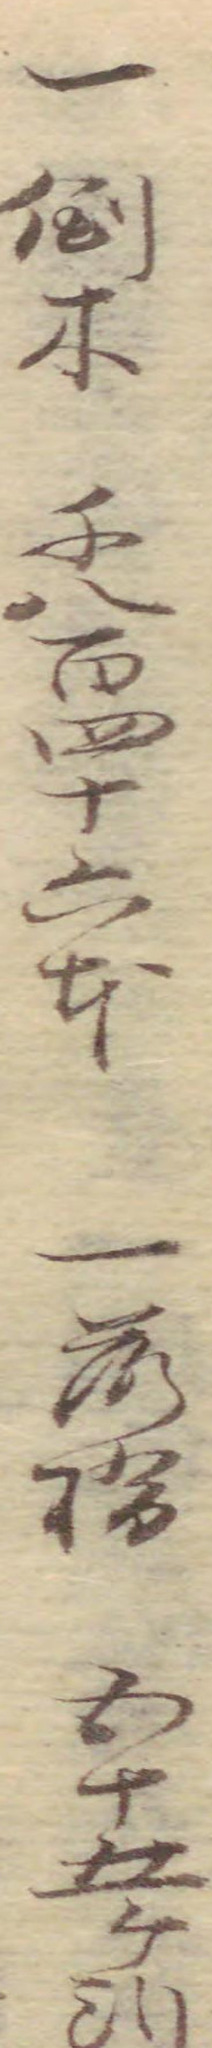一倒木千八百四十六本一落橋五十五ケ所
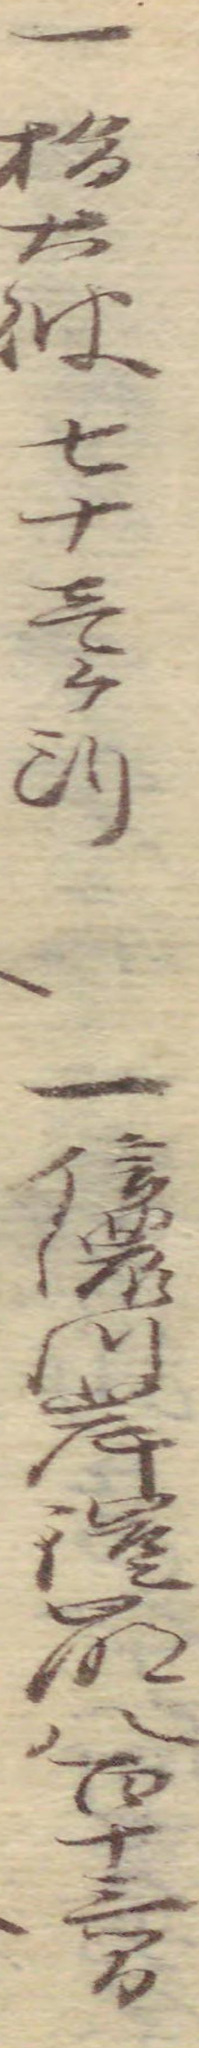一橋大破七十壱ケ所一信濃川岸港崩八百十三間
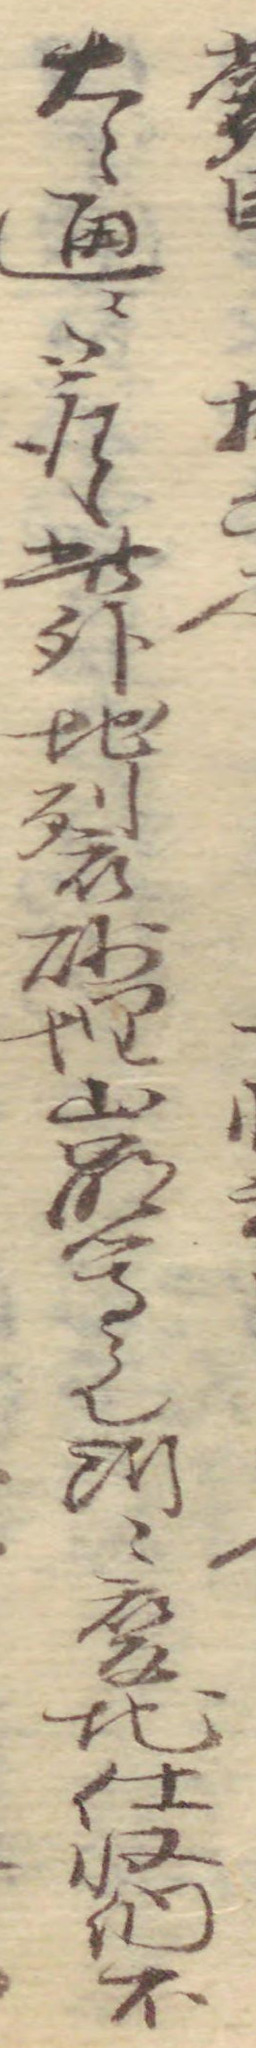右之通ニ御座候此外地裂砂埋山崩等ニて所〻変地仕収納不
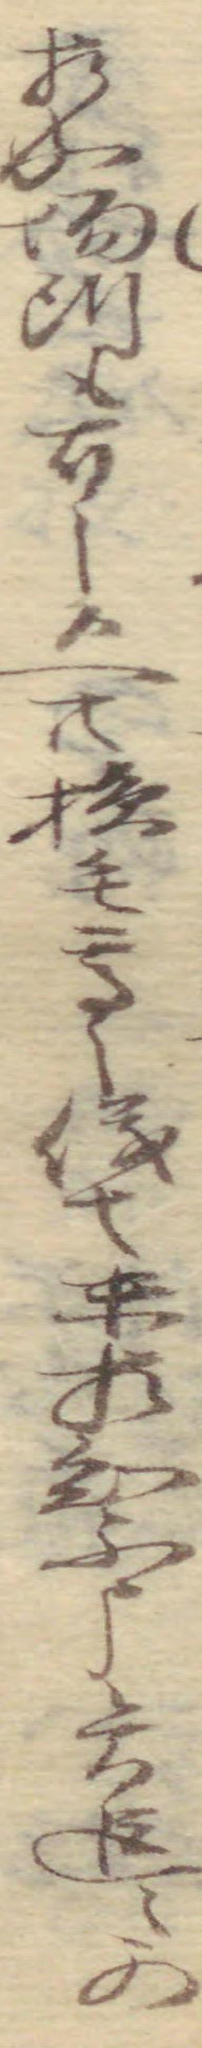相成場所も有之候へ共損毛高之儀は未相知不申間追〻可
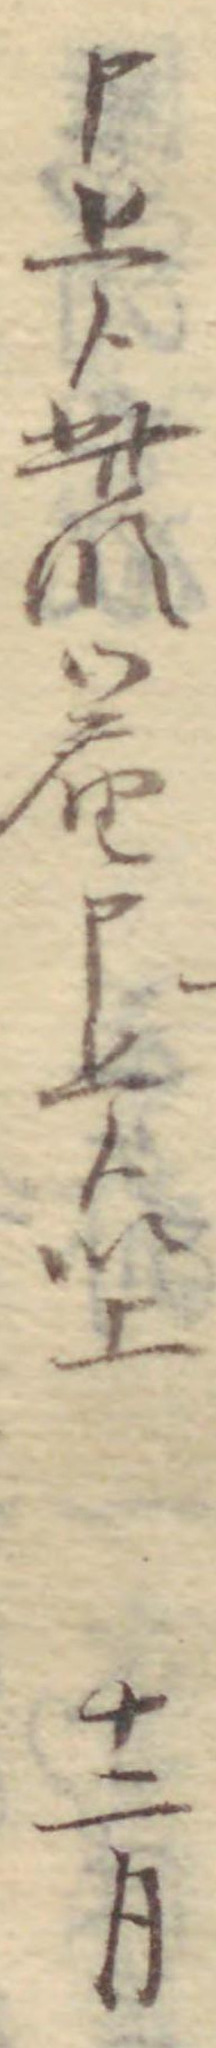申上候此段御届申上候以上十二月
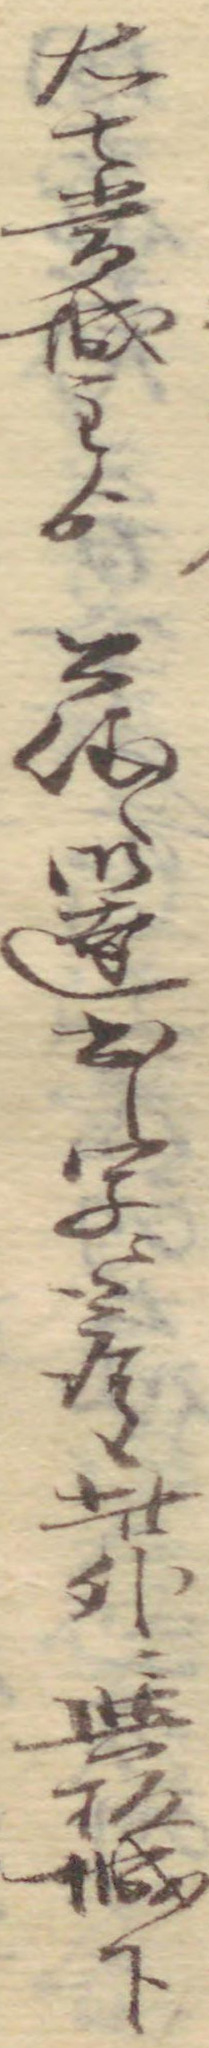右は当城主ゟ公儀へ御達書之写ニ御座候此外ニ与板城下
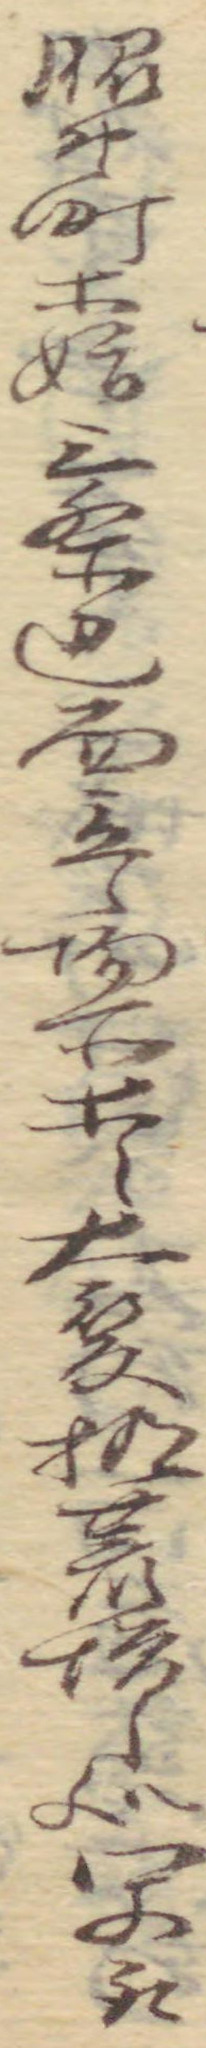脇野町等始三条辺面立之場所等之大変極荒増之処写取
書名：鶯宿雑記. 巻199-200
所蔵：国立国会図書館 National Diet Library, JAPAN
